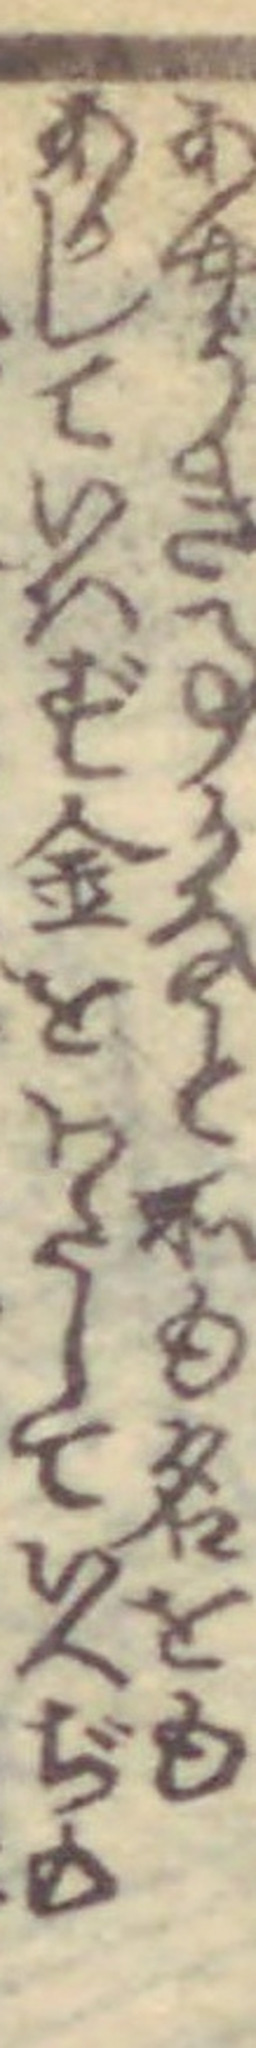あかしていはず金をわたしていへぢの
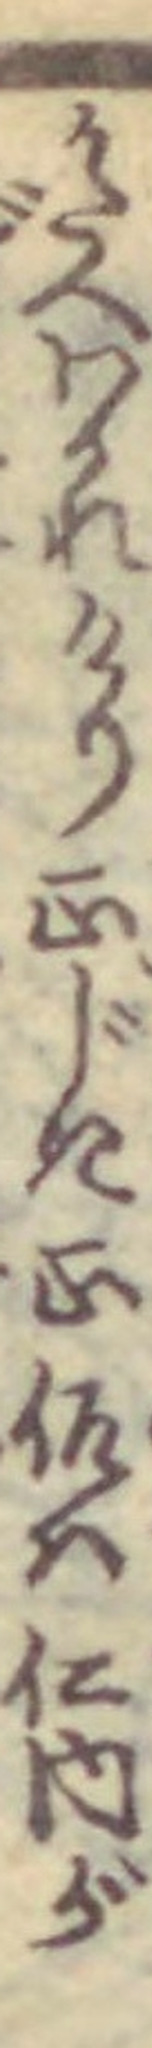かたへわかれけり正じき正作は仁内が
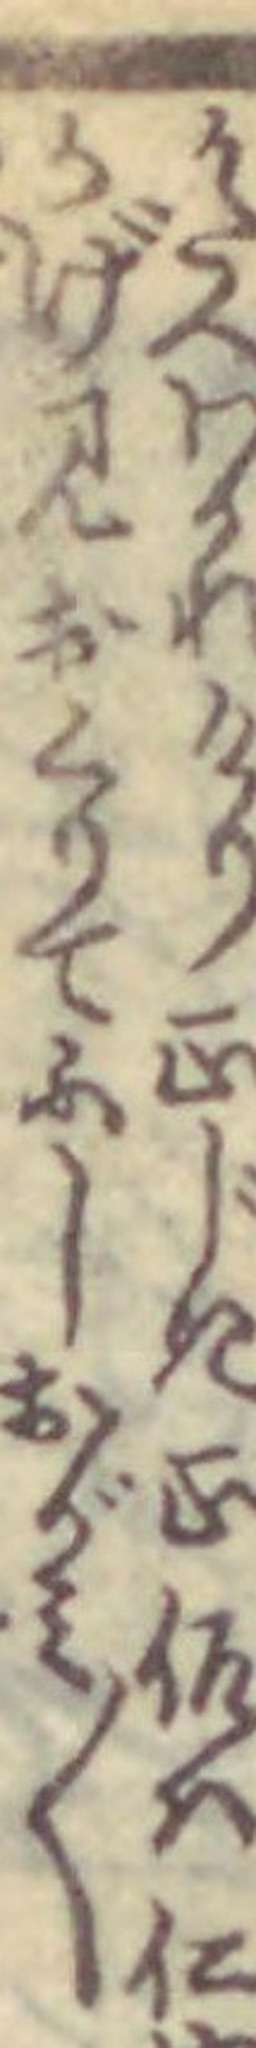かげ見おくりてふしおがみ〳〵
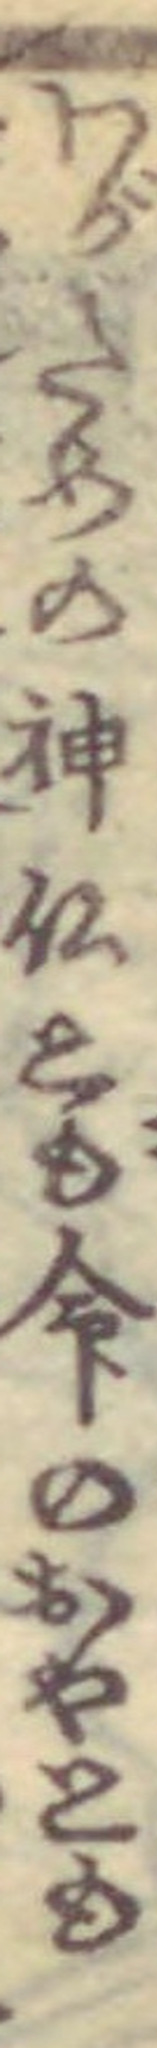わがための神仏とも命のおやとも
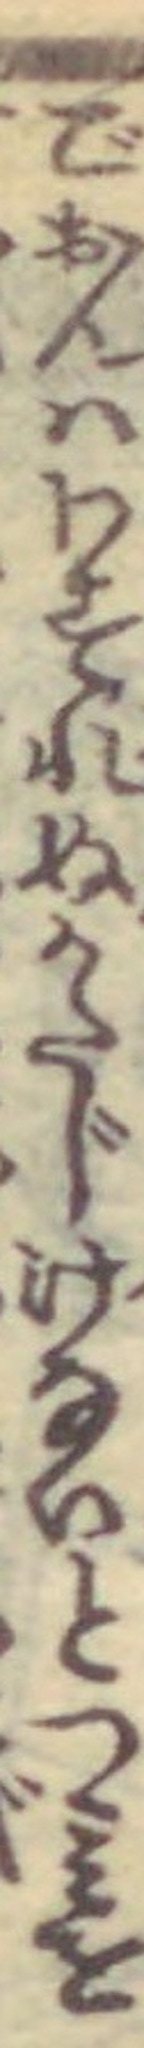ごおんはわすれぬかたじけないとつゝみを
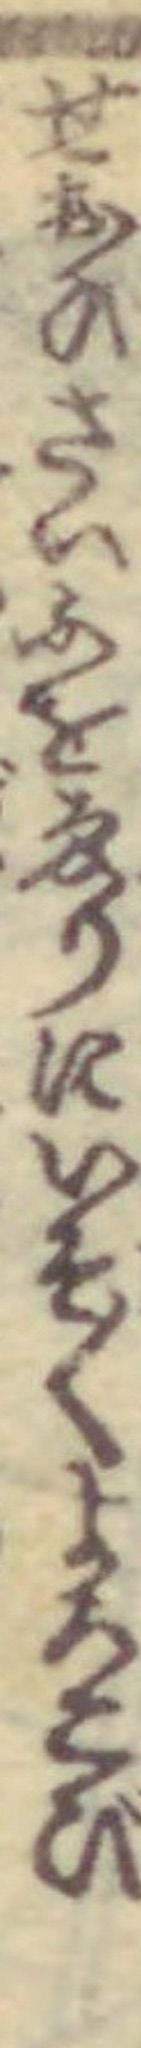せおひさいふをゑりにいそ〳〵よろこび
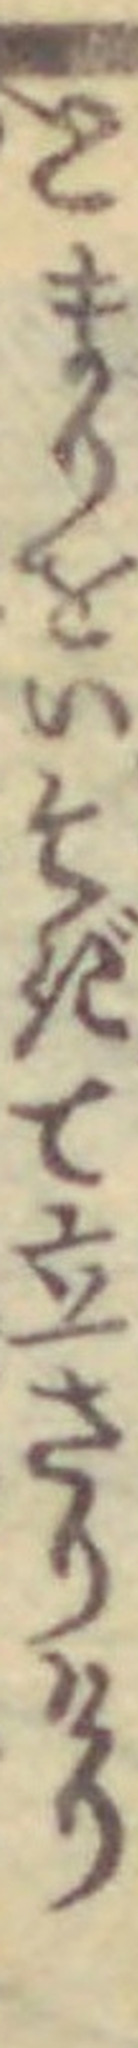とまりをいそぎて立さりけり
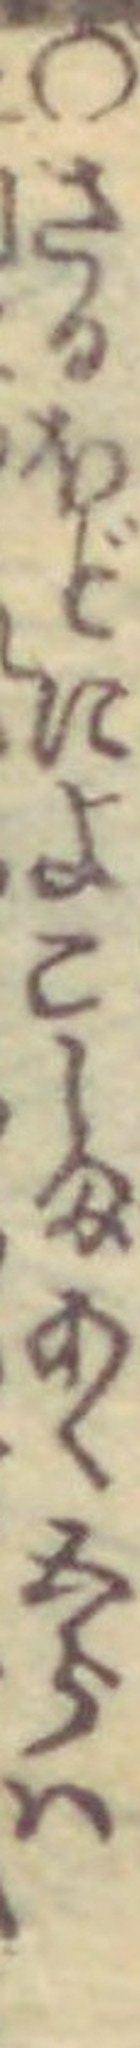○さるほどによこしまあく五郎は
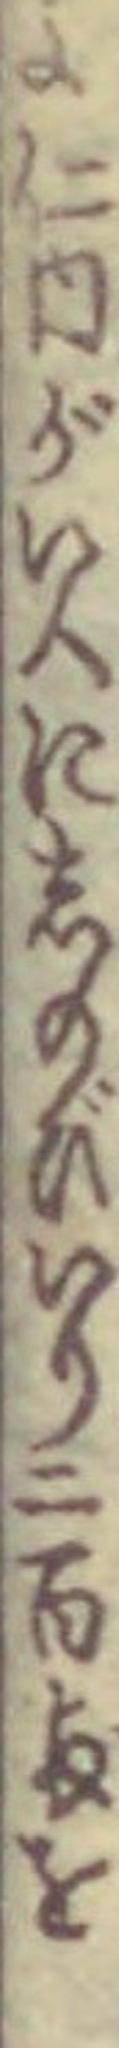そのよ仁内がいへにしのびいり二百両を
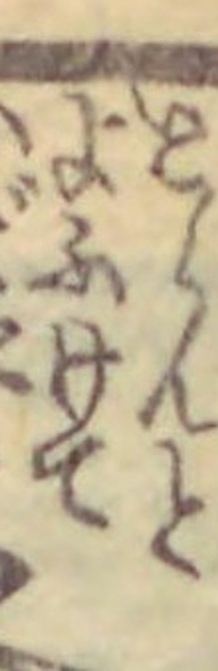よふけて
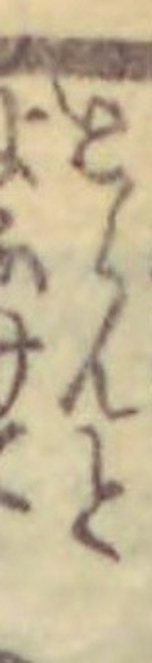とらんと
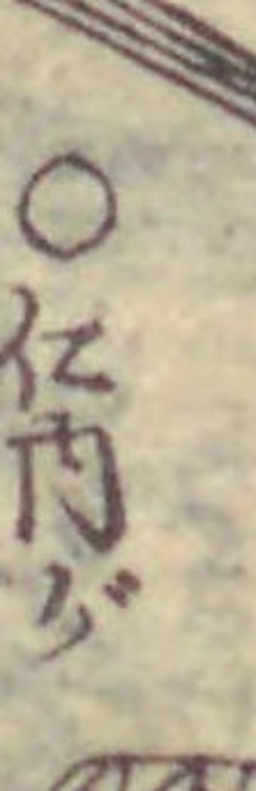○仁内が
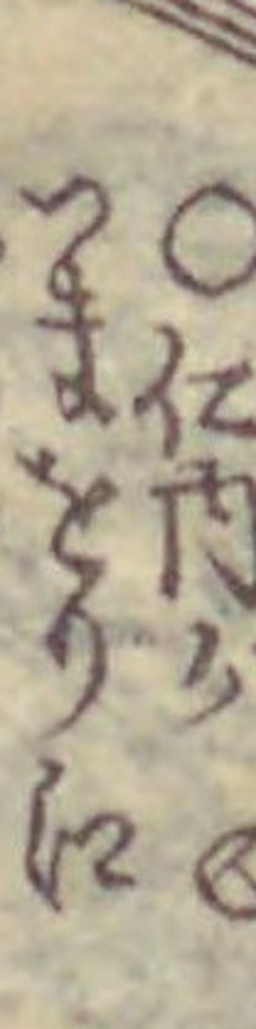つまをり江
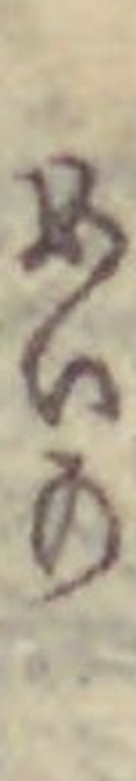めいの
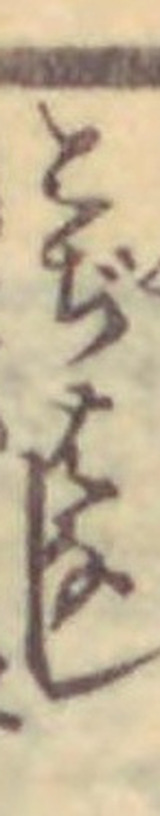こぢはなし
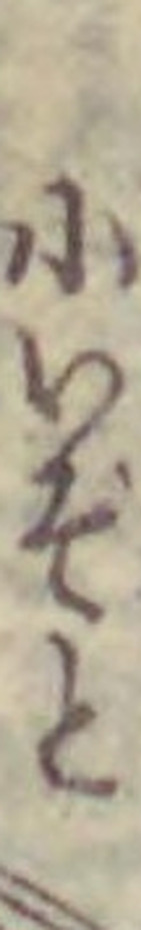小いそと
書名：八ツ目鱣因縁物語 3巻
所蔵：国立国会図書館 National Diet Library, JAPAN
